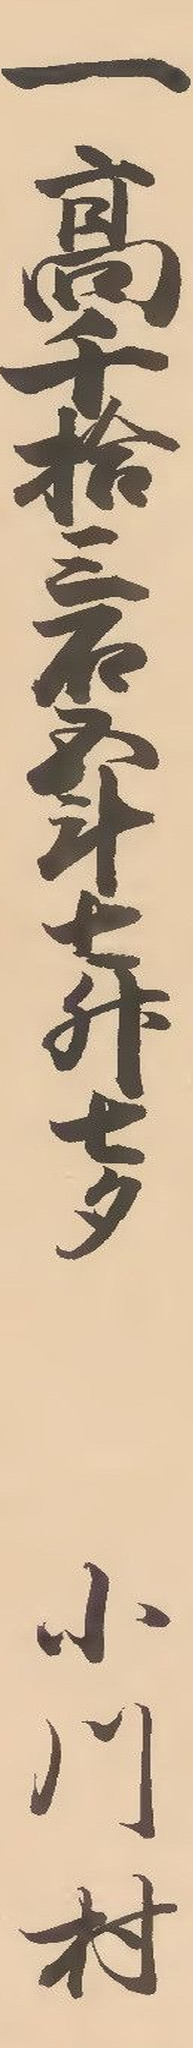一高千拾三石五斗七升七勺小川村

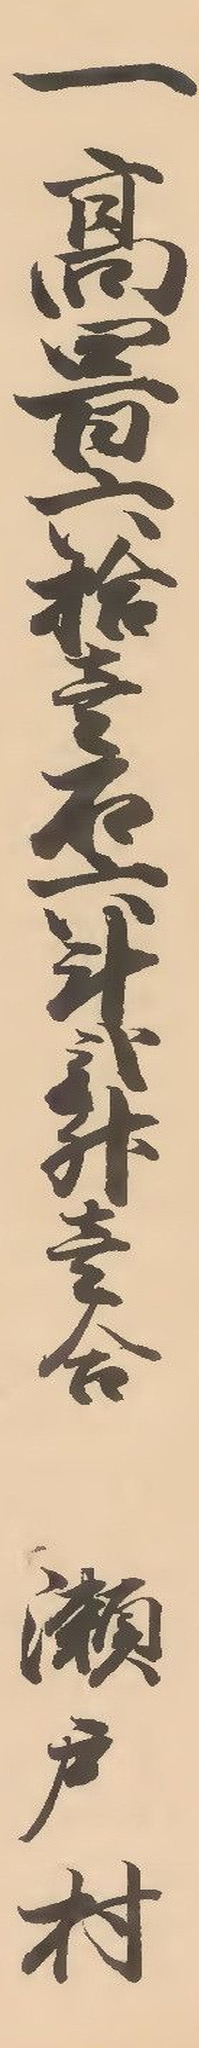一高四百六拾壱石六斗弐升壱合瀬戸村
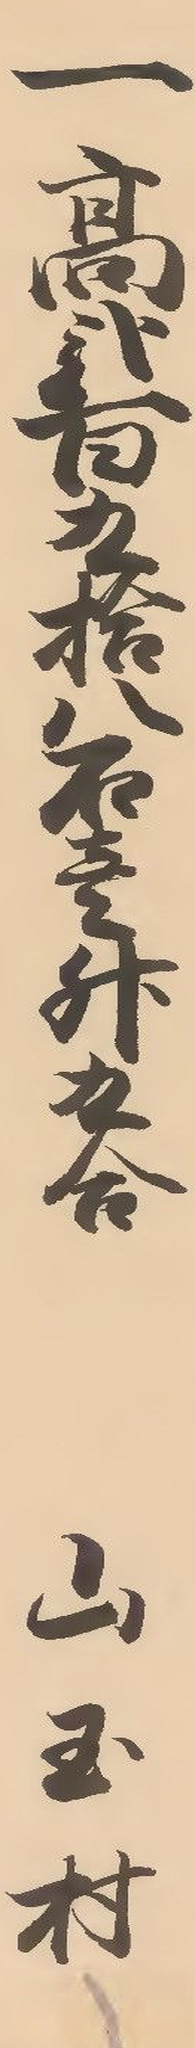一高弐百九拾八石壱升九合山玉村
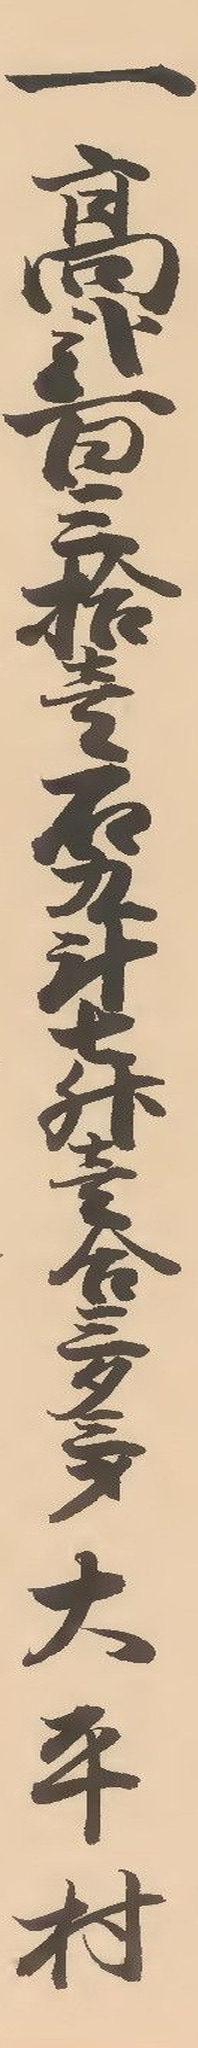一高弐百三拾壱石九斗七升壱合三勺三才大平村
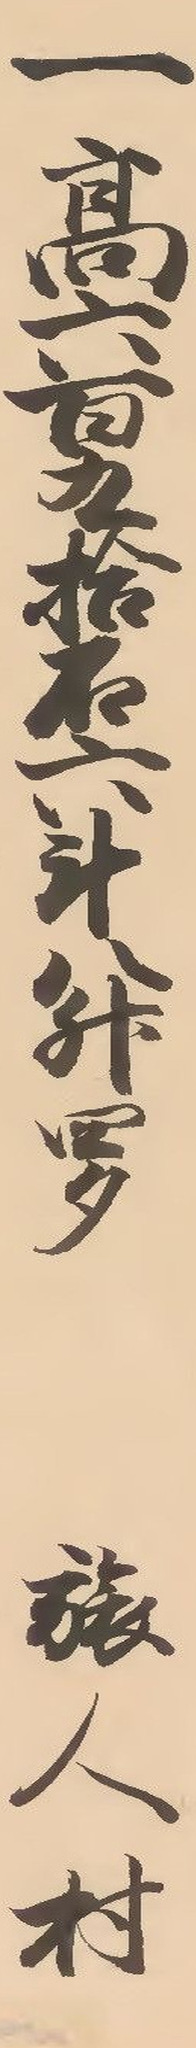一高六百九拾石六斗八升四勺旅人村
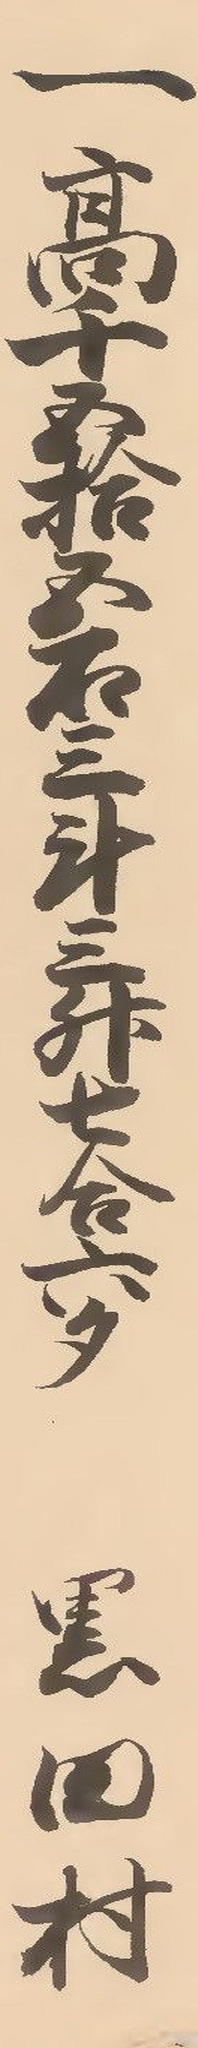一高千五拾五石三斗三升七合六勺黒田村
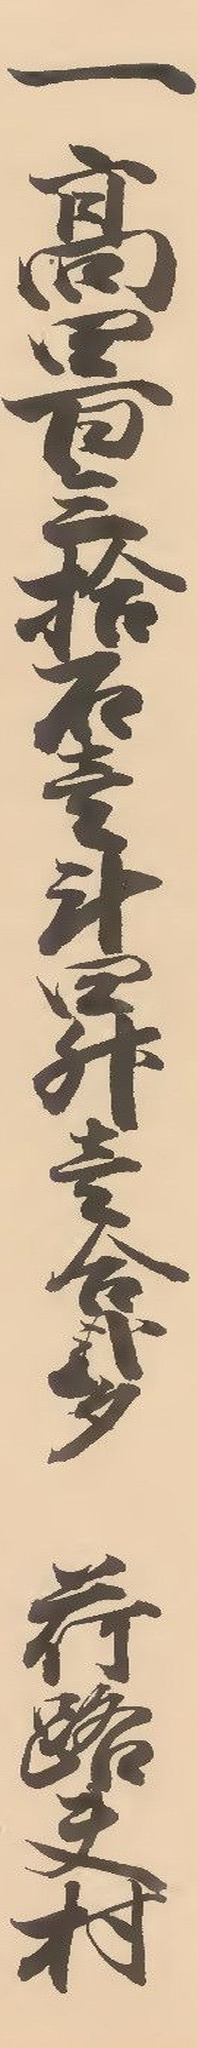一高四百三拾石壱斗四升壱合弐勺荷路夫村
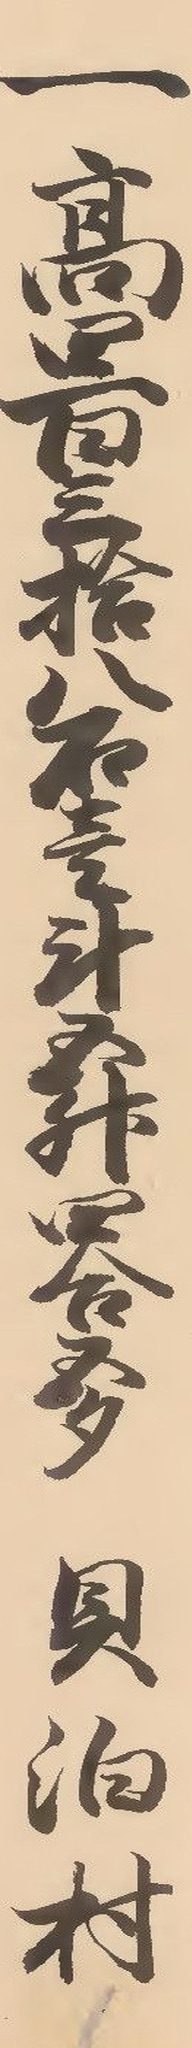一高四百三拾八石壱斗五升四合五勺貝泊村
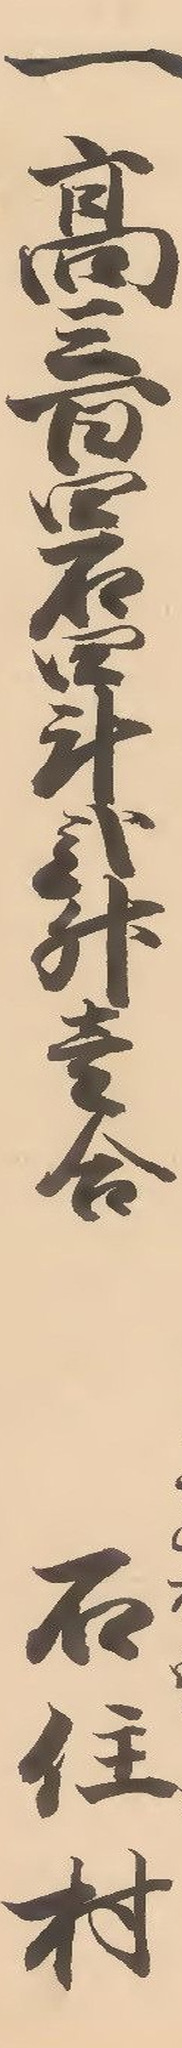一高三百四石四斗弐升壱合石住村

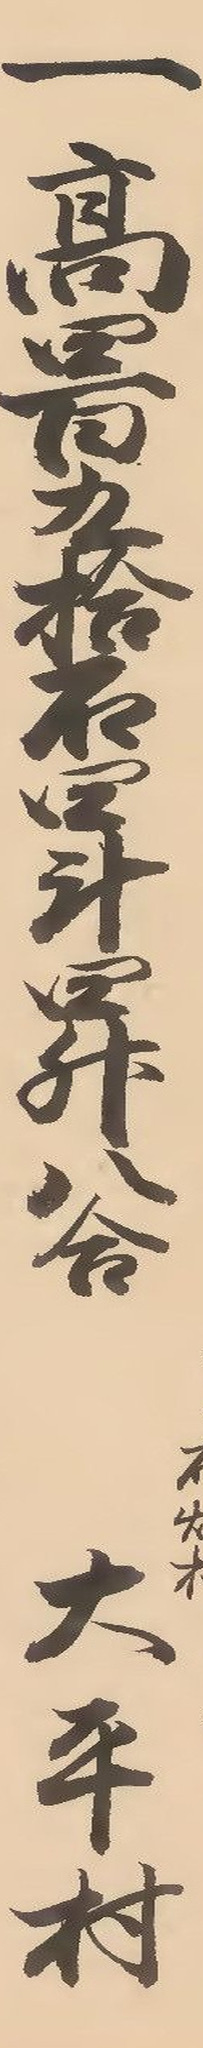一高四百九拾石四斗四升八合大平村
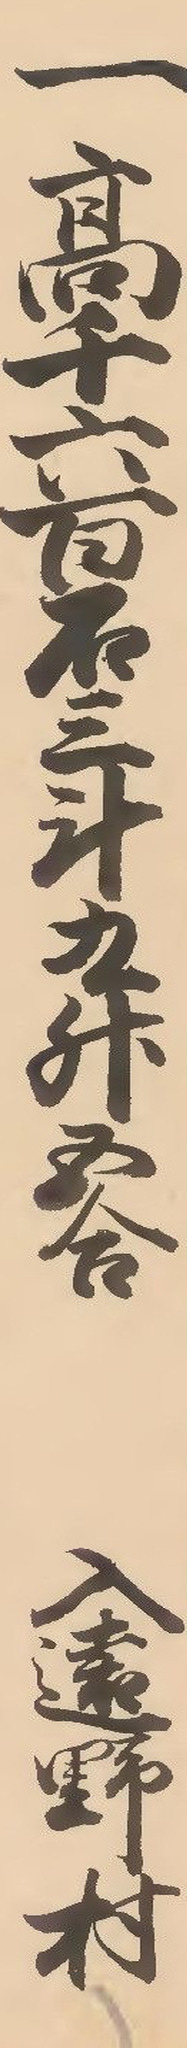一高千六百石三斗九升五合入遠野村
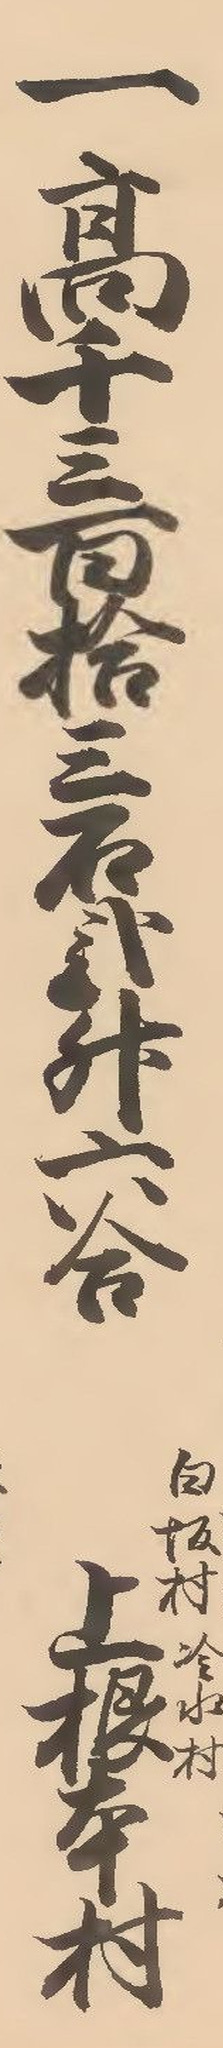一高千三百拾三石弐升六合上根本村
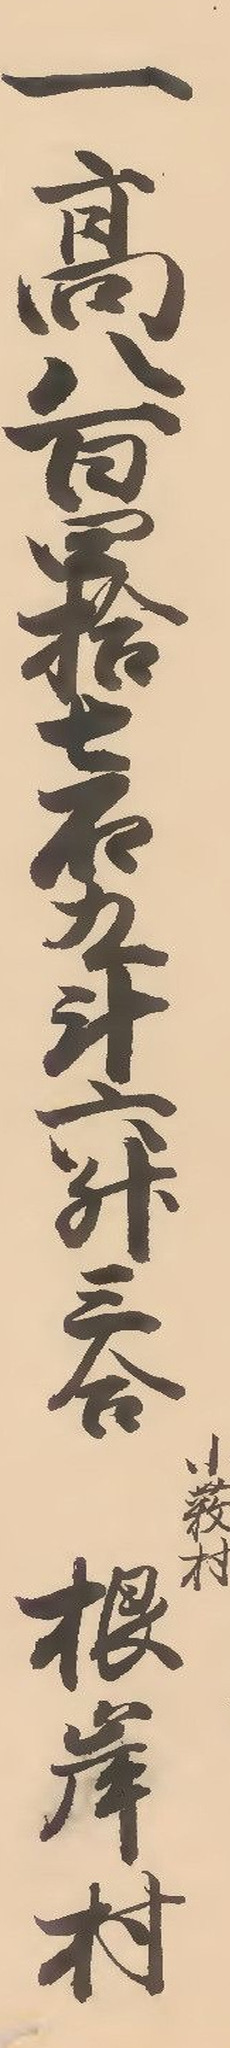一高八百四拾七石九斗六升三合根岸村
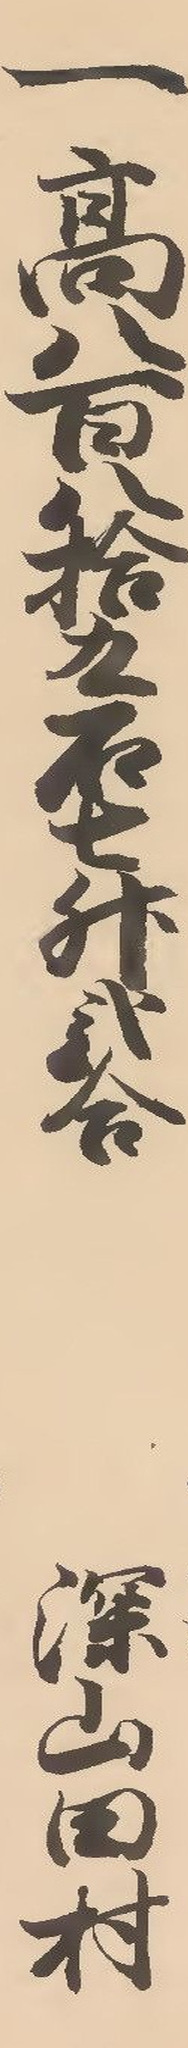一高八百八拾九石七升弐合深山田村
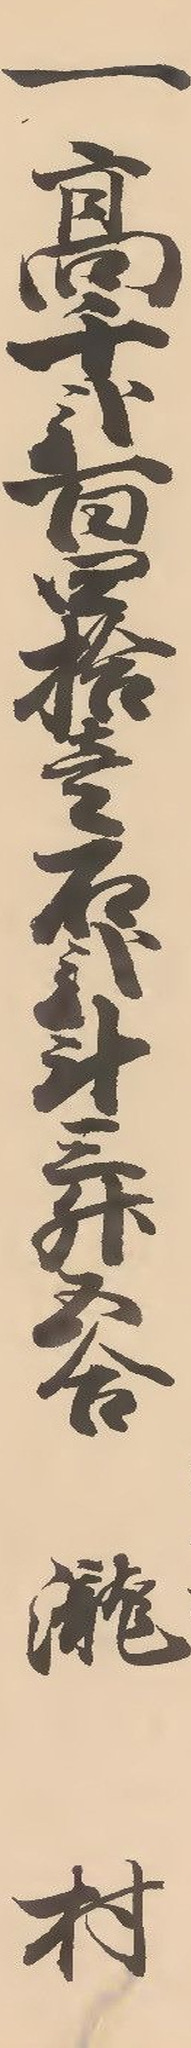一高千弐百四拾壱石弐斗三升五合滝村
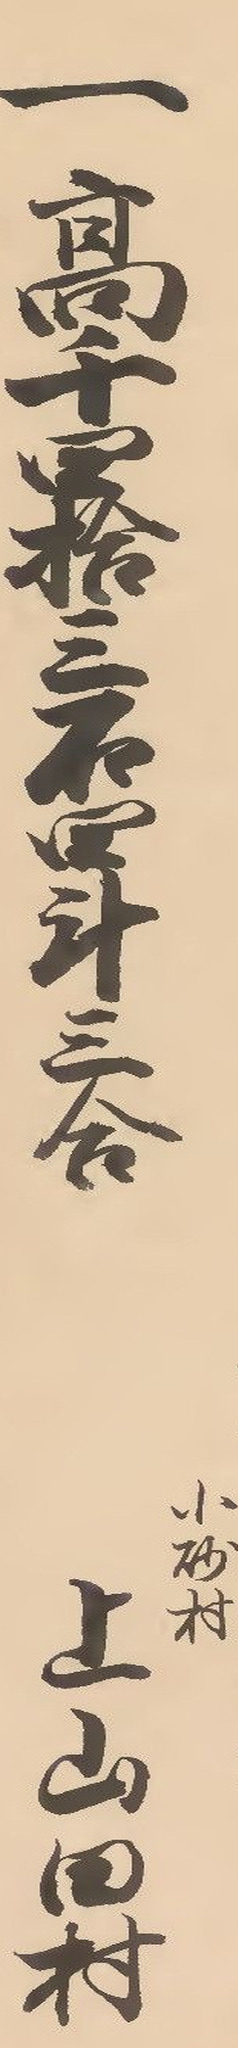一高千四拾三石四斗三合上山田村
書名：陸奥国郷帳　３
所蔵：国立公文書館 National Archives of Japan
